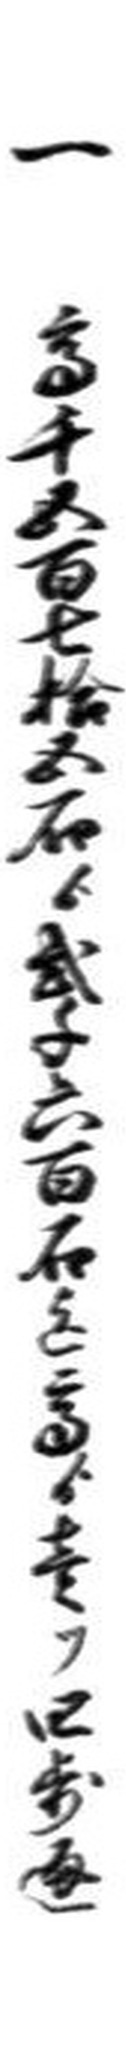一高千五百七拾五石ゟ弐千六百石迄高ゟ壱ツ四歩通
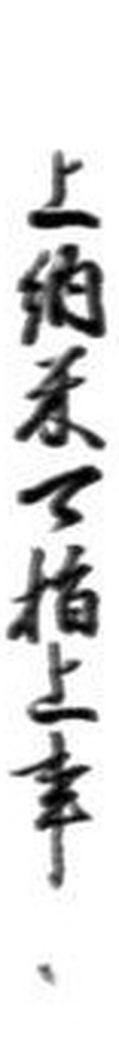上納米可指上事
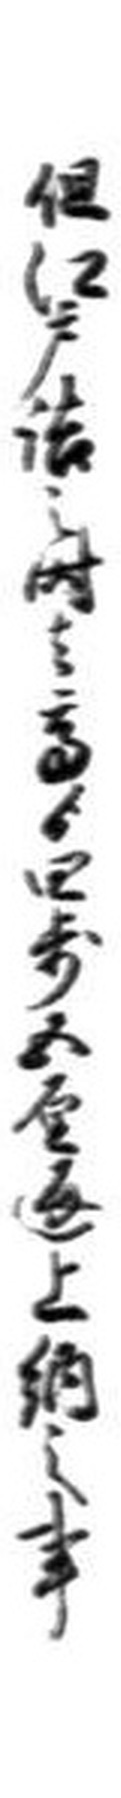但江戸詰之時者高ゟ四歩五厘通上納之事

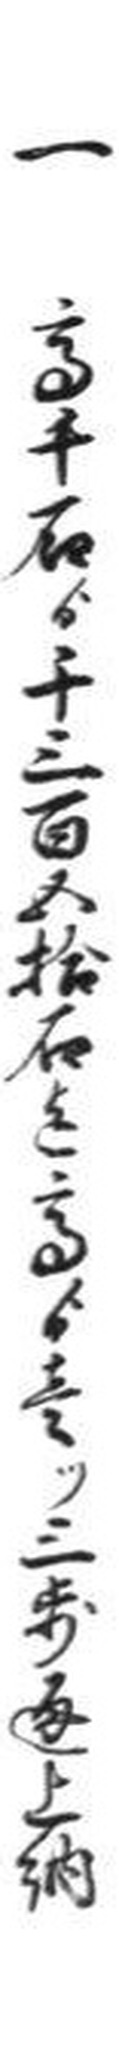一高千石ゟ千三百五拾石迄高ゟ壱ツ三歩通上納
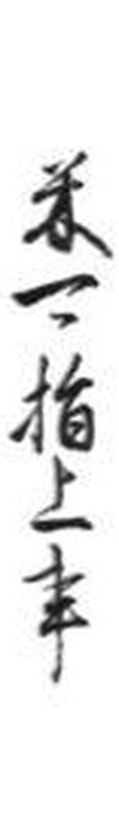米可指上事
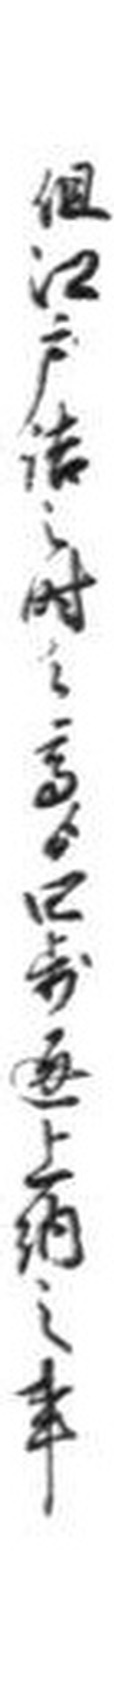但江戸詰之時者高ゟ四歩通上納之事
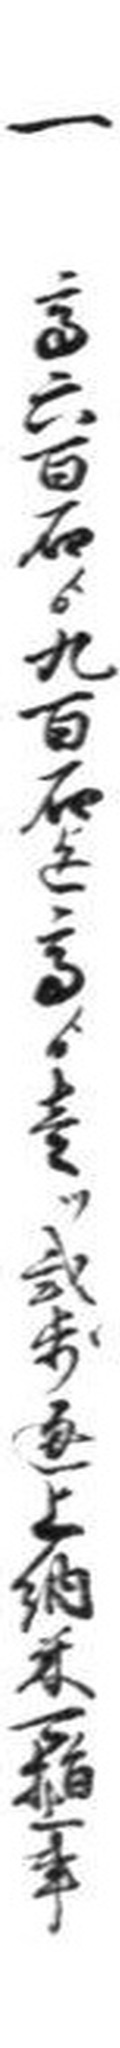一高六百石ゟ九百石迄高ゟ壱ツ弐歩通上納米可指上事
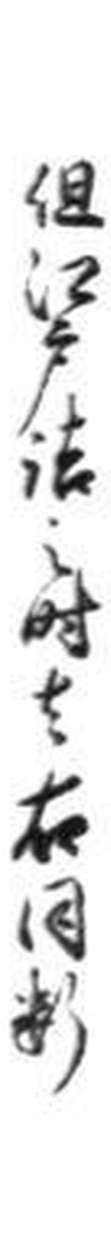但江戸詰之時者右同断
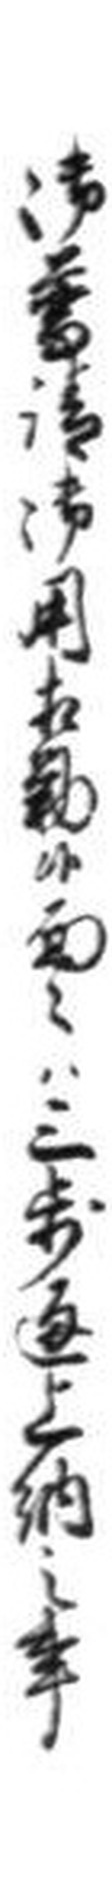御普請御用相勤候面々ハ三歩通上納之事
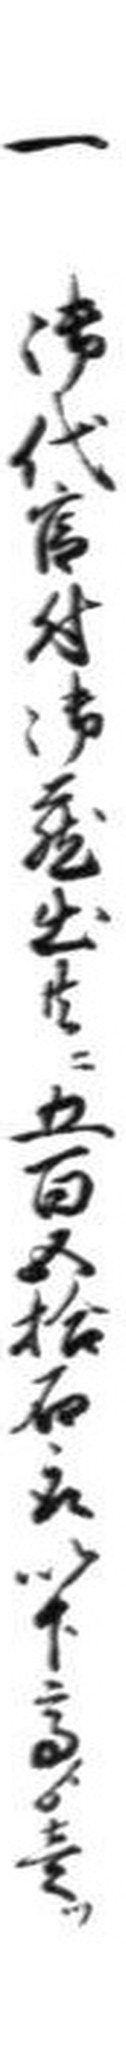一御代官付御蔵出共ニ五百五拾石取以下高ゟ壱ツ
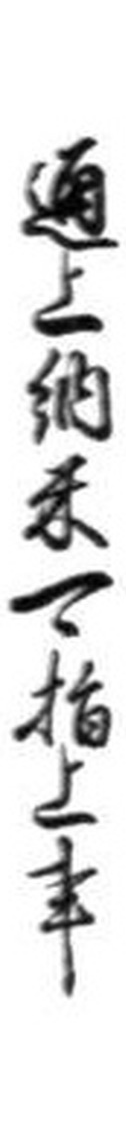通上納米可指上事
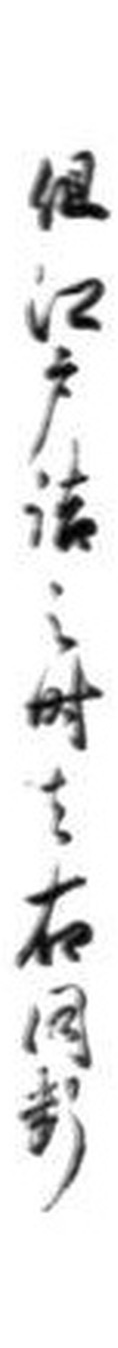但江戸詰之時者右同断
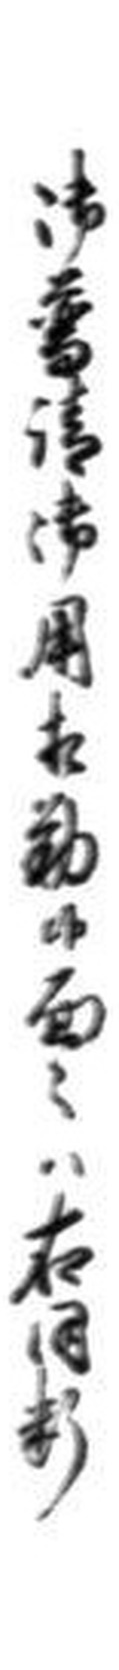御普請御用相勤候面々ハ右同断
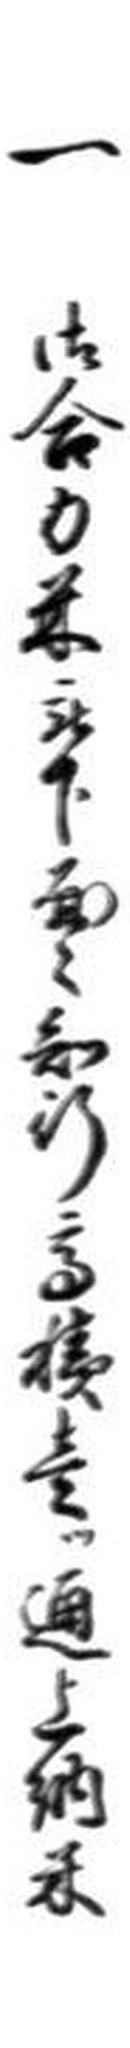一御合力米被下面々知行高積壱ツ通上納米
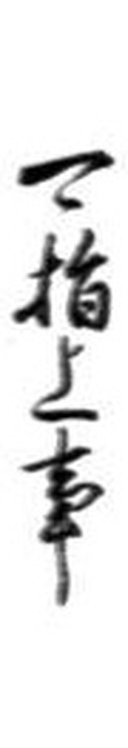可指上事
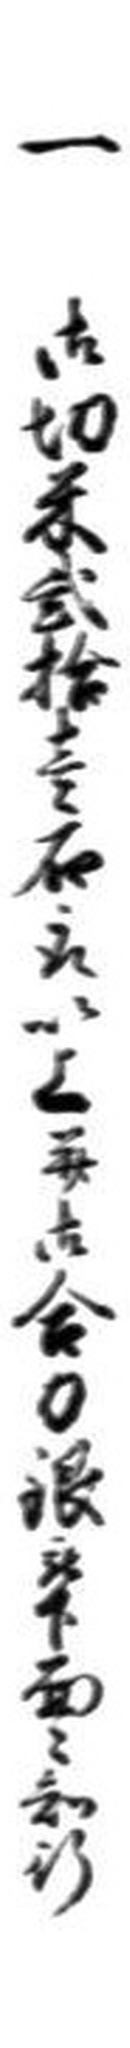一御切米弐拾壱石取以上并御合力銀被下面々知行
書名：家譜 三十一 吉邦公 享保元年
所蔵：福井県文書館 Fukui Prefectural Archives
